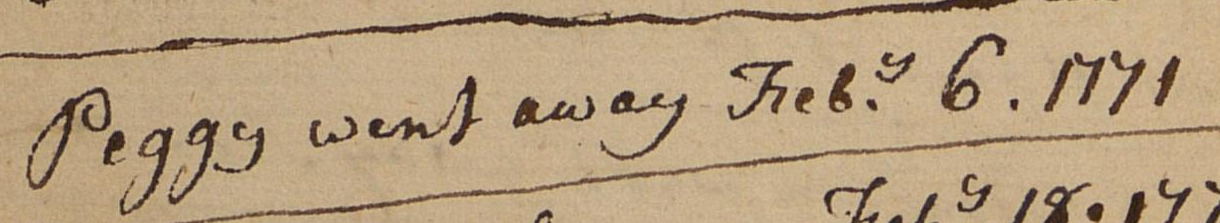Peggy went away Feb^y. 6. 1771
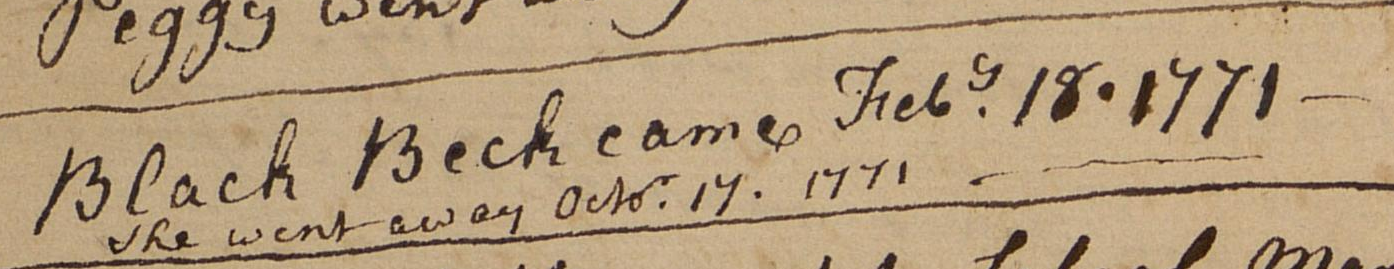Black Beck came Feb^y. 18. 1771
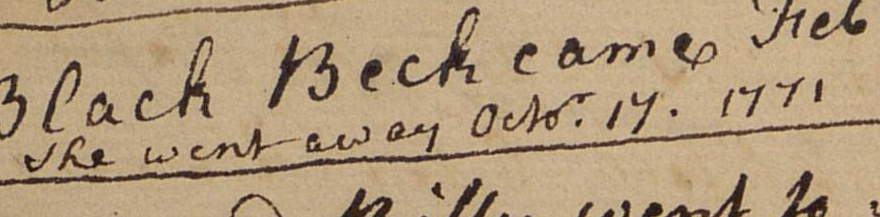she went away Octo^r. 17. 1771
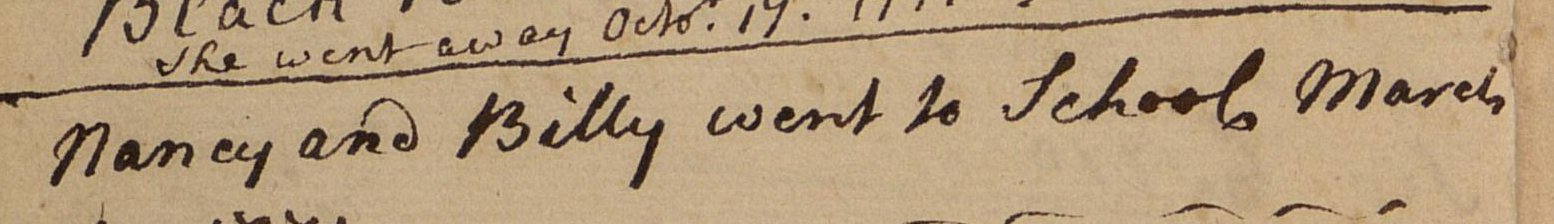Nancy and Billy went to School March
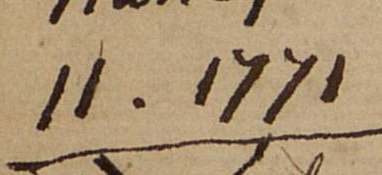11. 1771
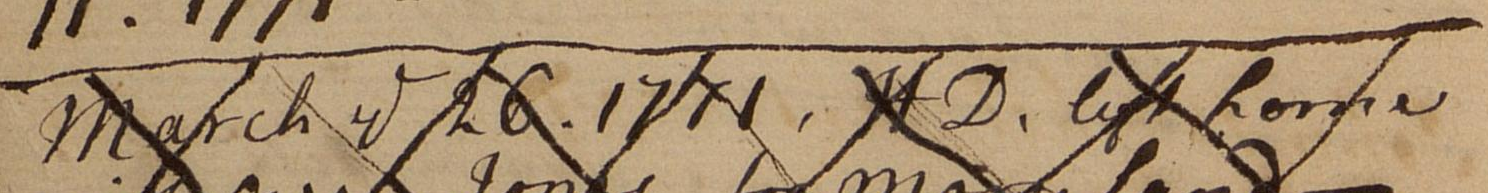March y^e 26. 1771. HD. left home
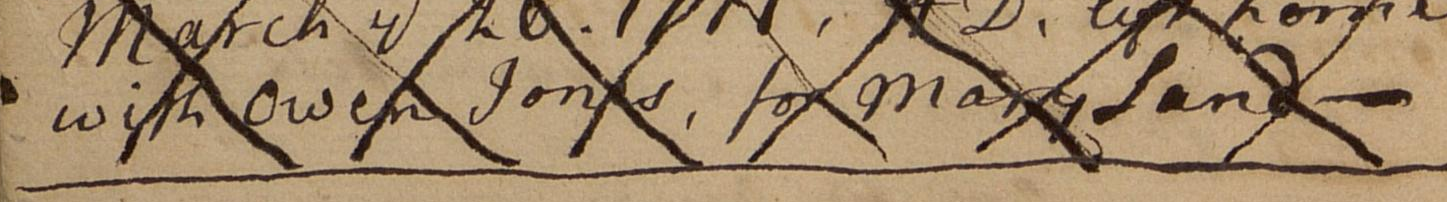with Owen Jones, for Mary Land-
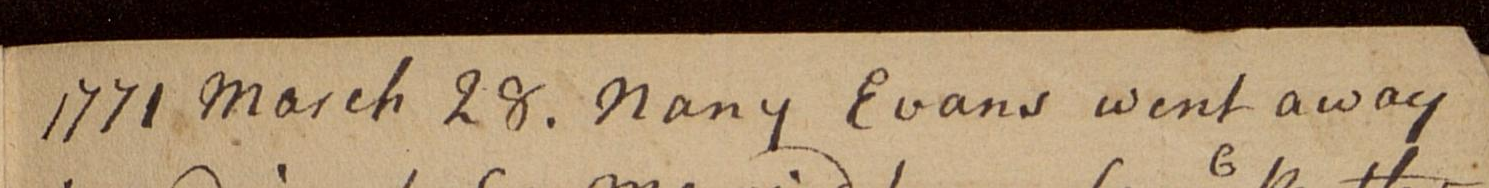1771 March 28. Nany Evans went away
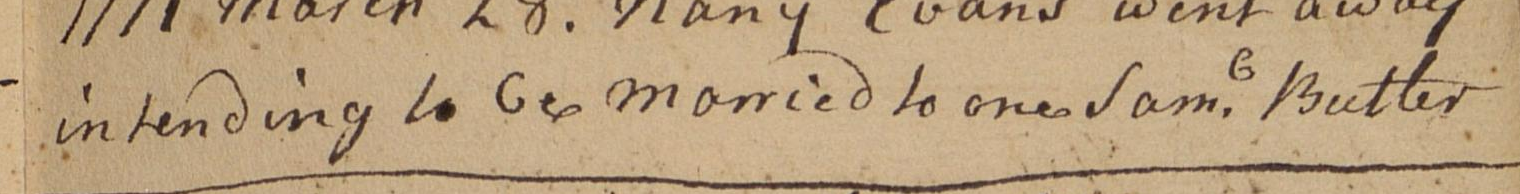intending to be married to one Sam^l. Butler
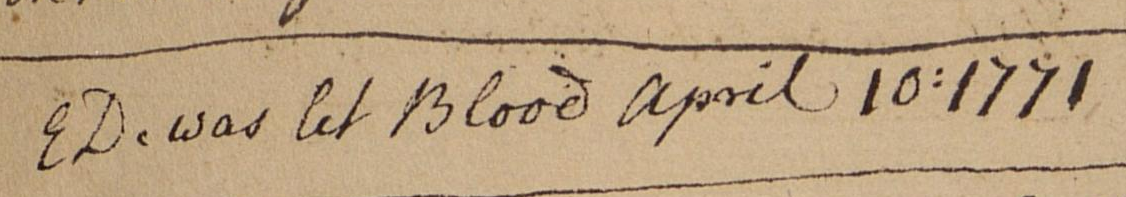ED. was let Blood April 10:1771
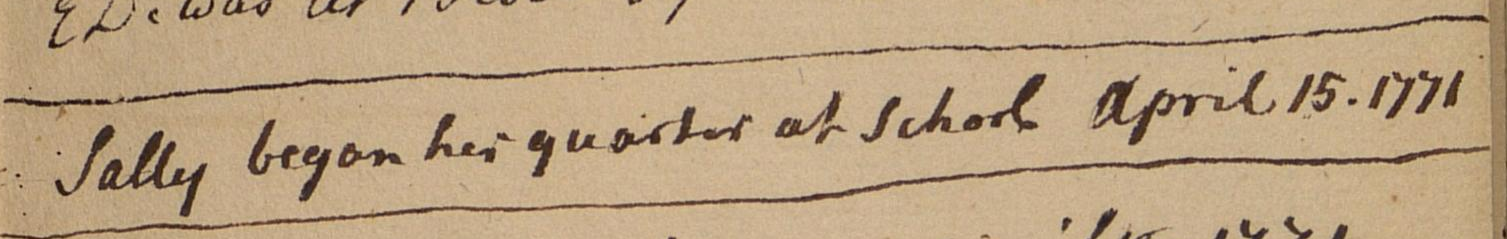Sally began her quarter at School April 15.1771
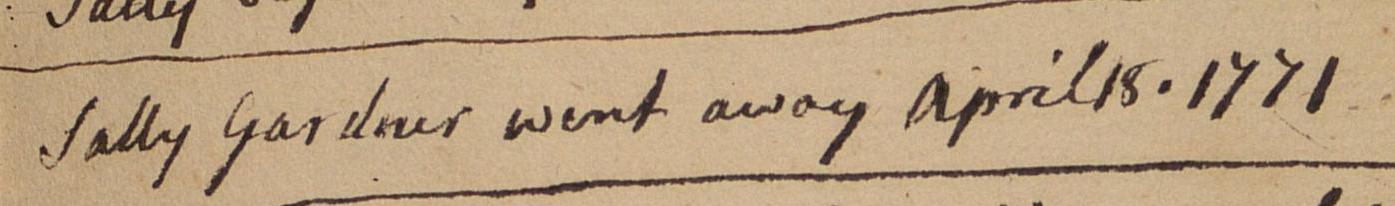Sally Gardner went away April 18.1771
